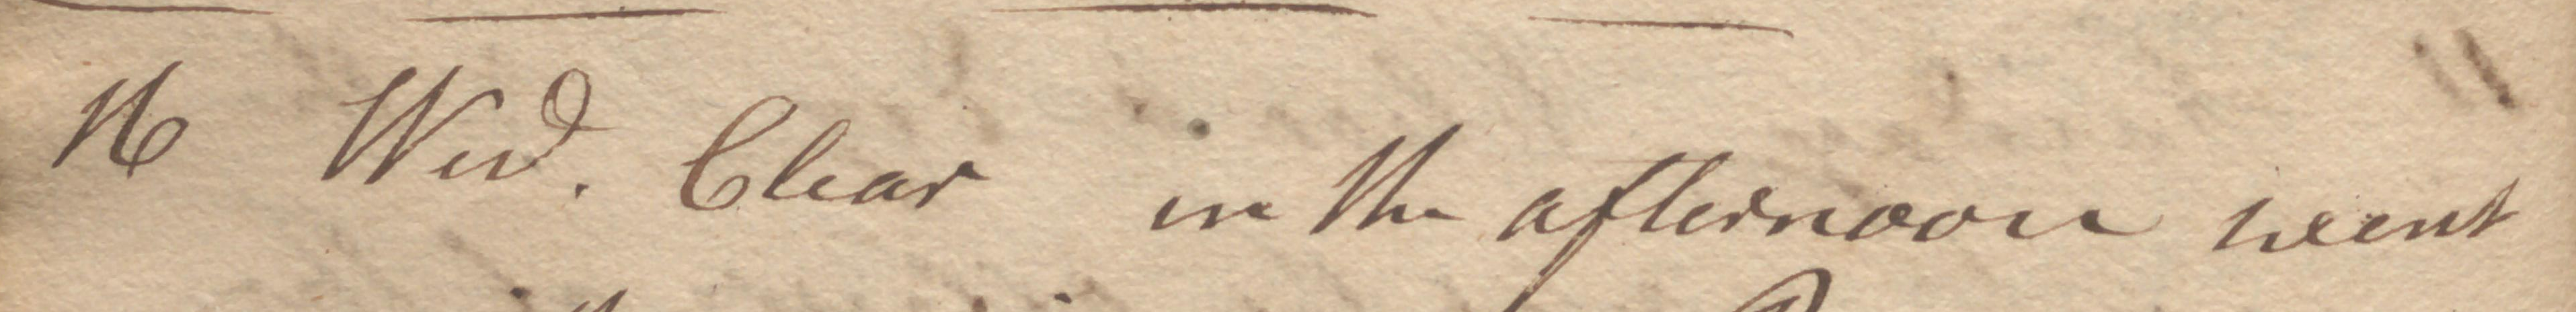16 Wed. Clear in the afternoon went
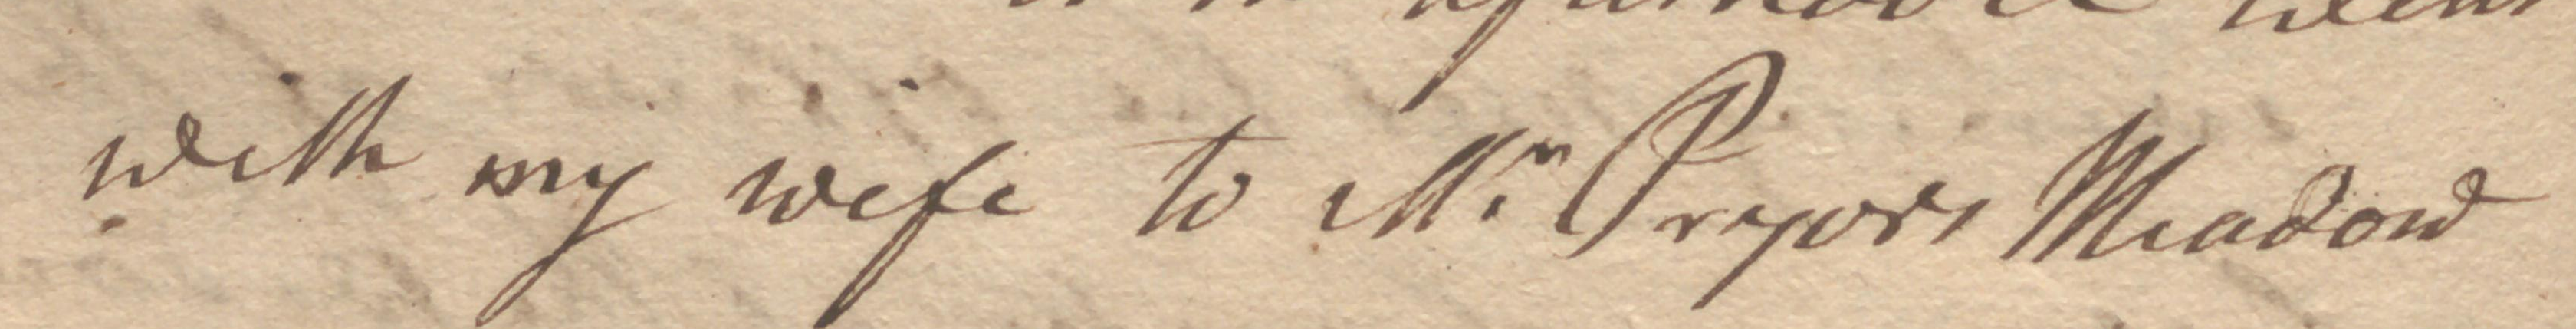with my wife to M^r. Pryors Meadow
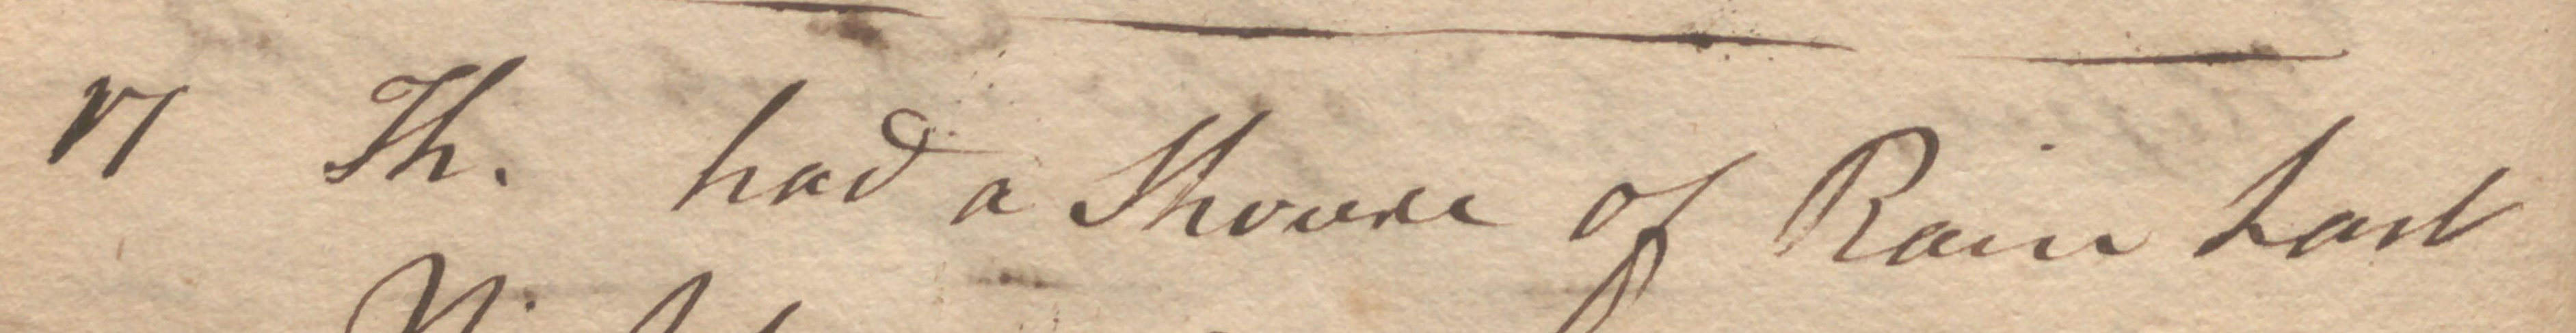17 Th. had a Shoure of Rain Last
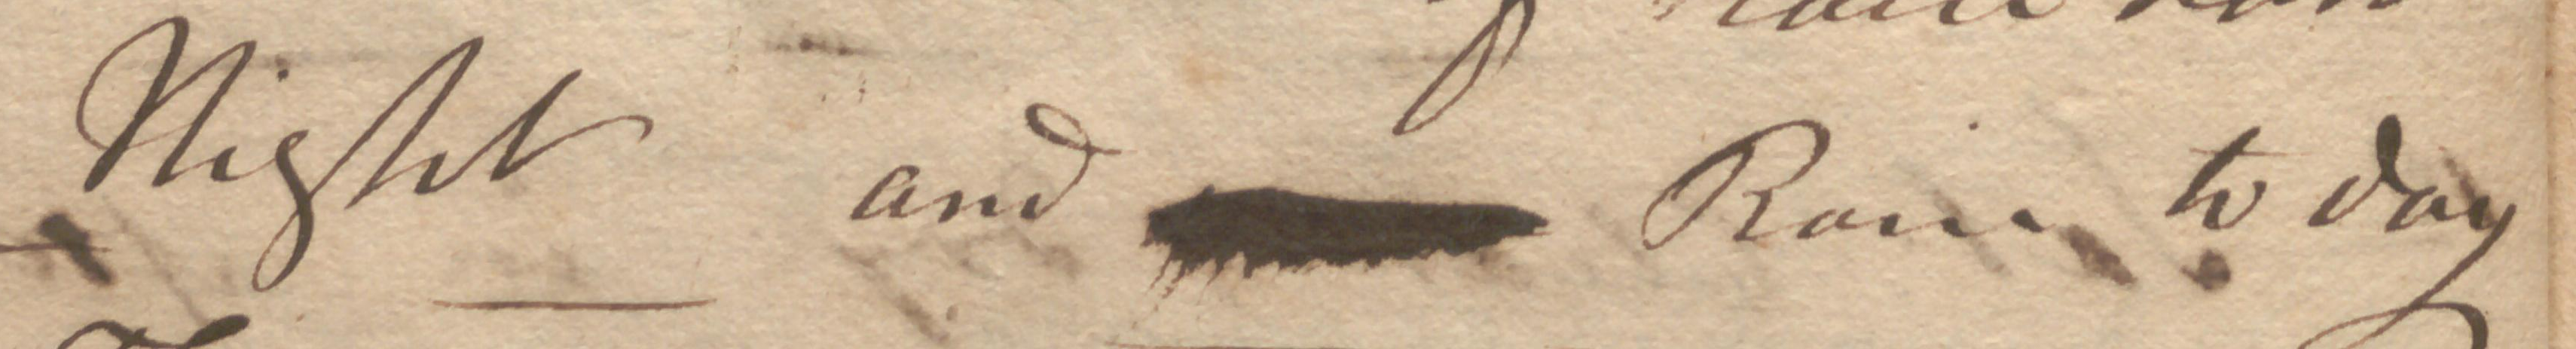Wight and [_____] Rain to day
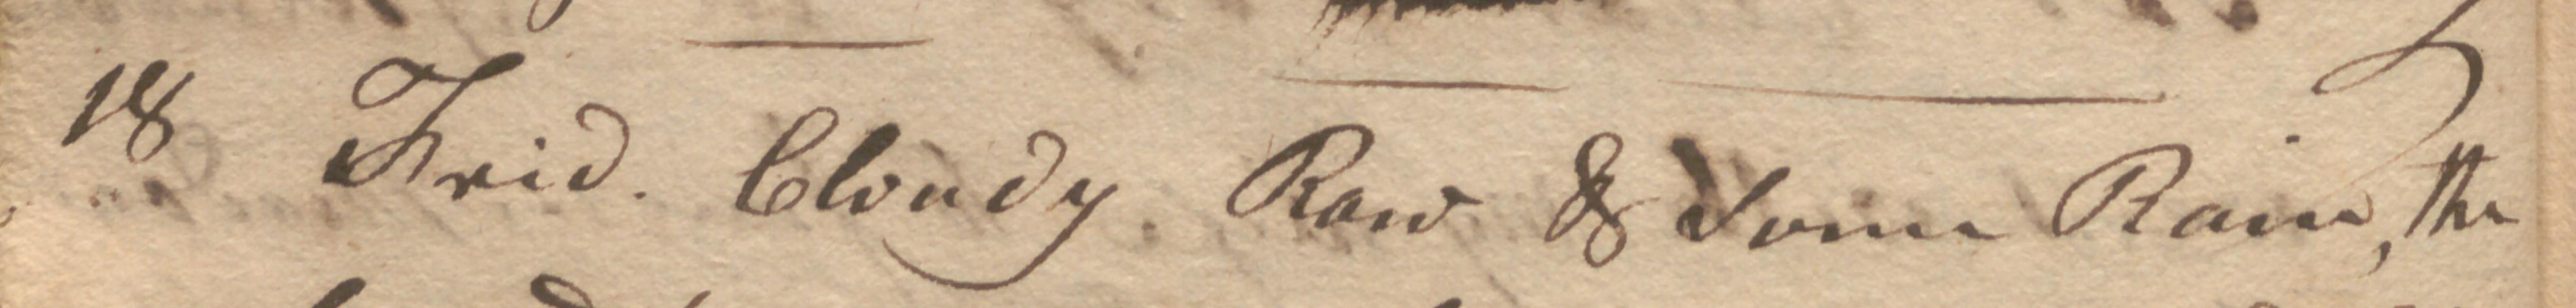18 Frid. Cloudy. Raw & some Rain the
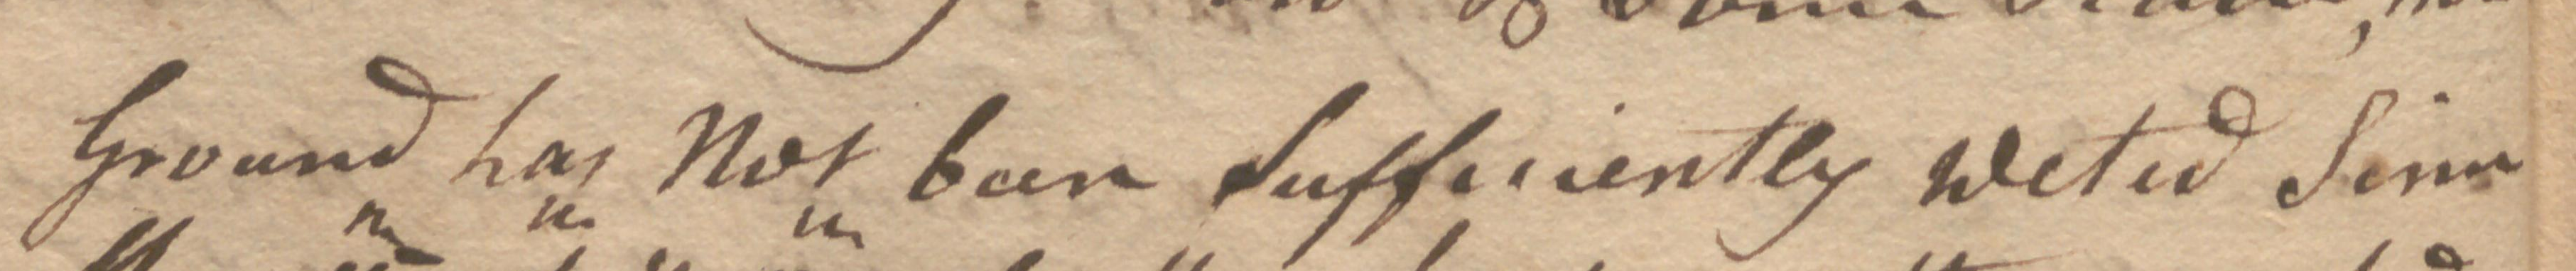Ground has Not been Sufficiently weted Since
